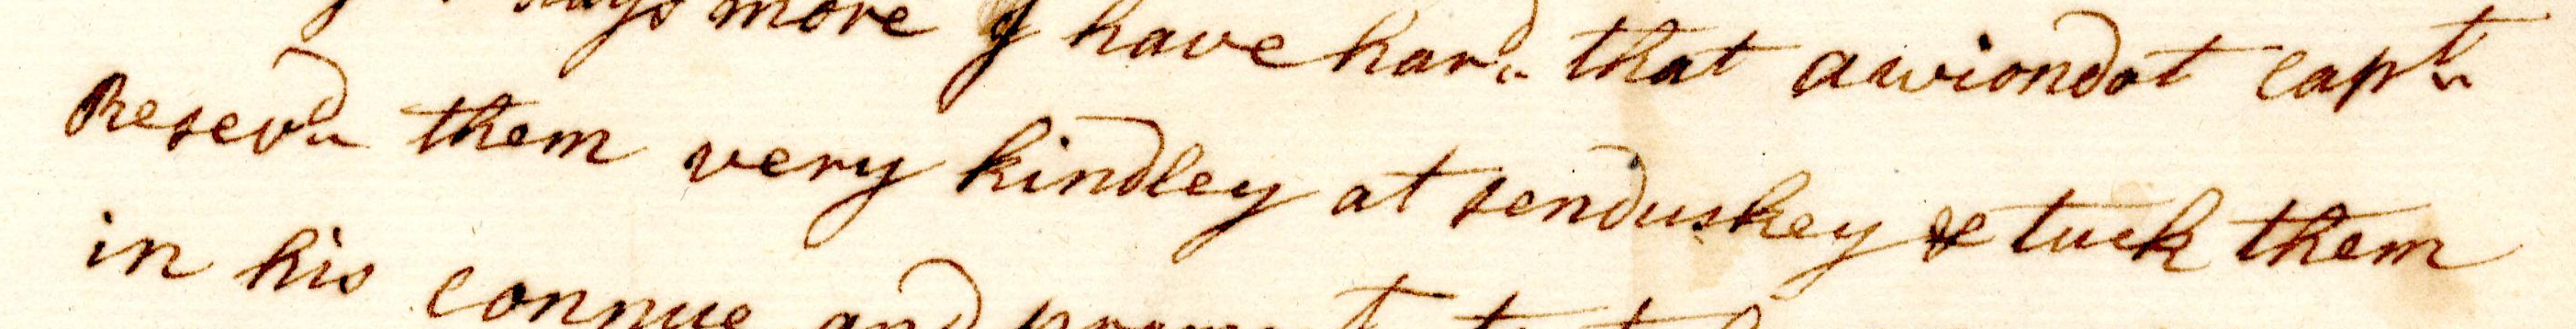Resev^d them very kindley at senduskey & tuck them
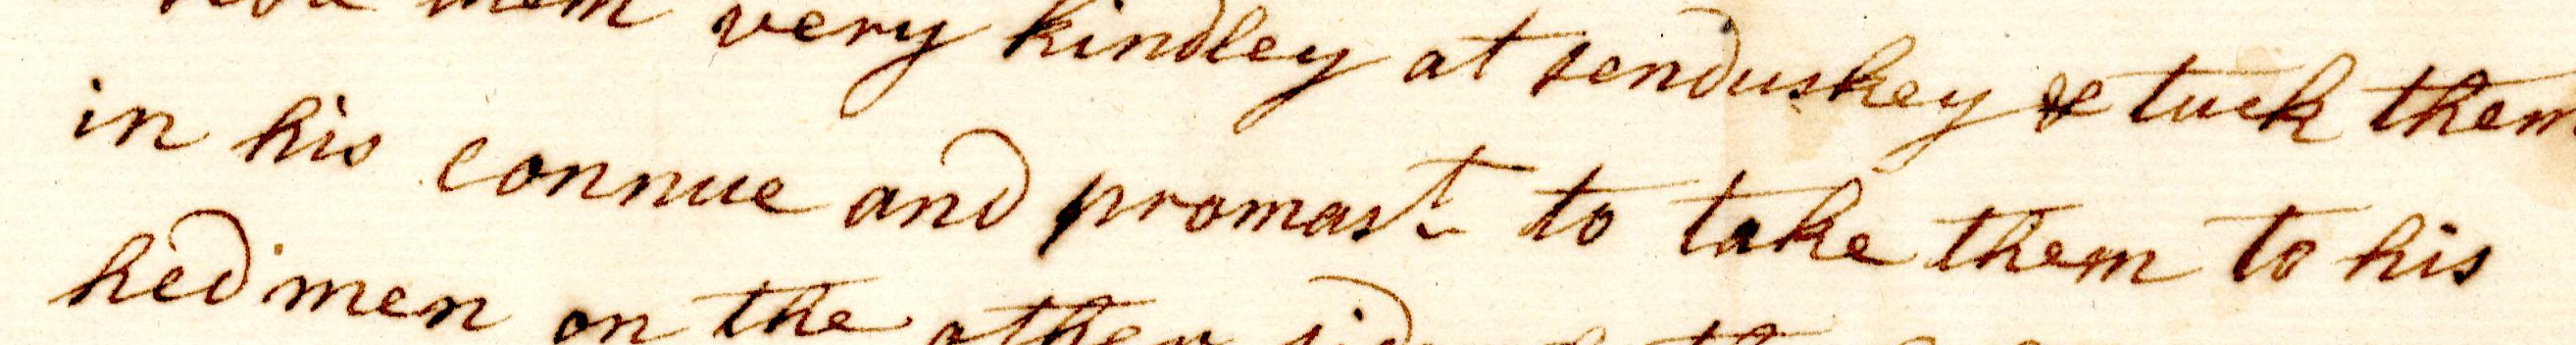in his connue and promas^t to take them to his
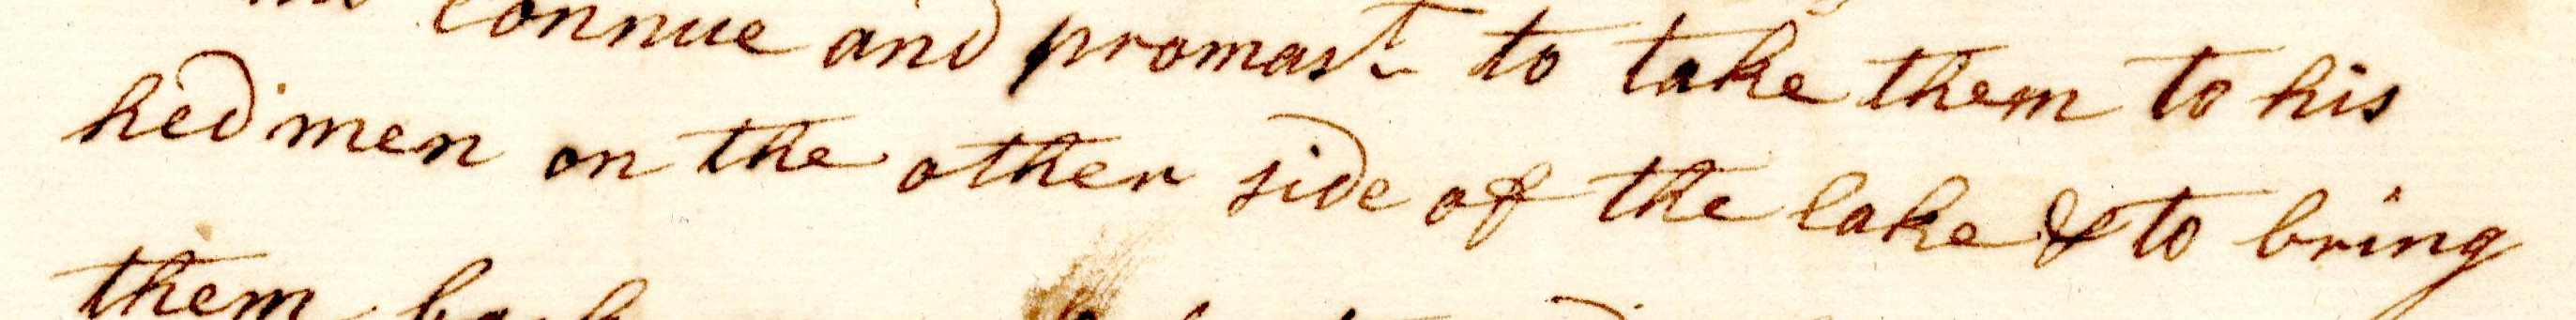hed men on the other side of the lake & to bring
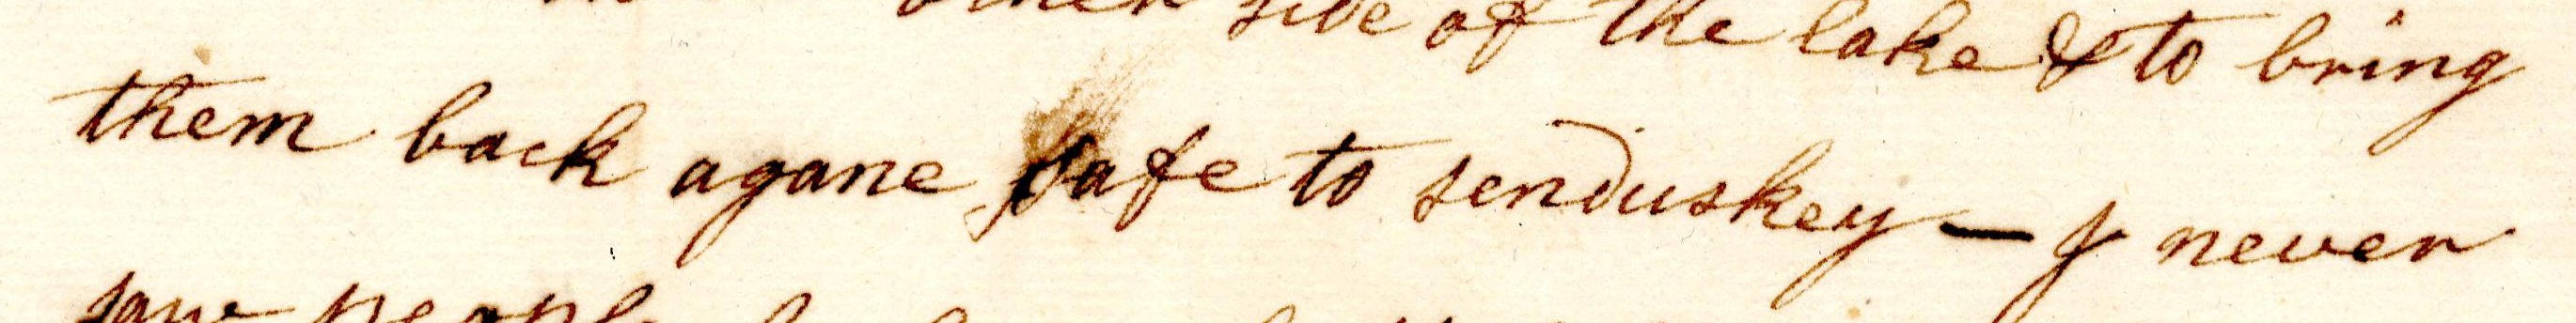them back agane safe to senduskey- I never
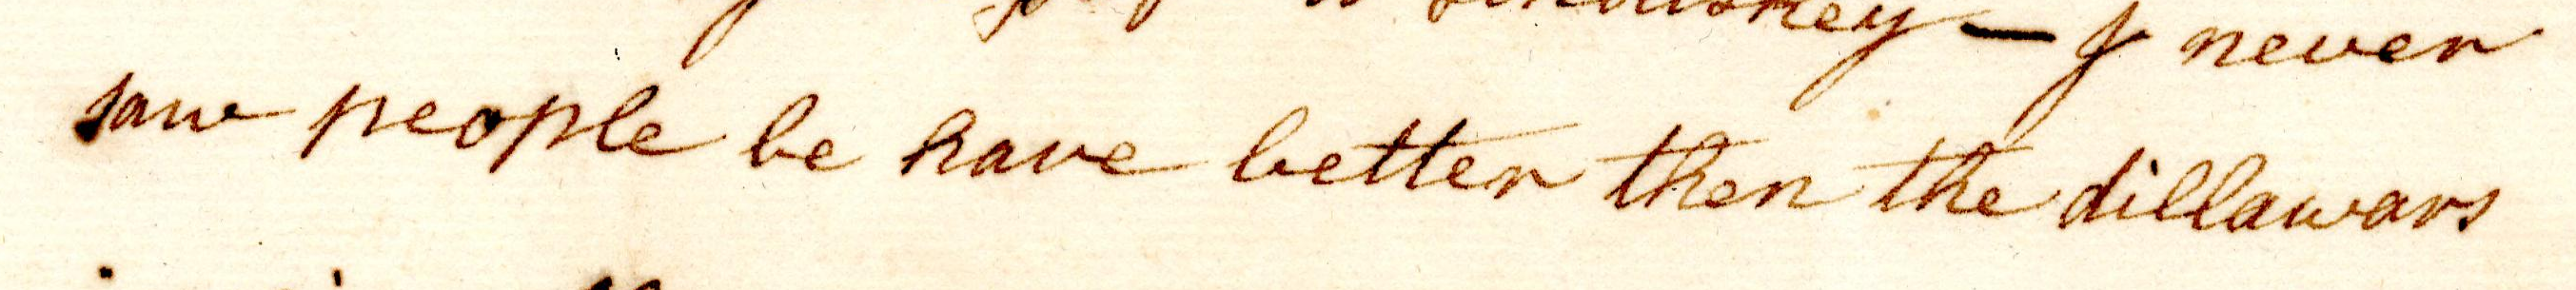saw people be have better then the dillawars
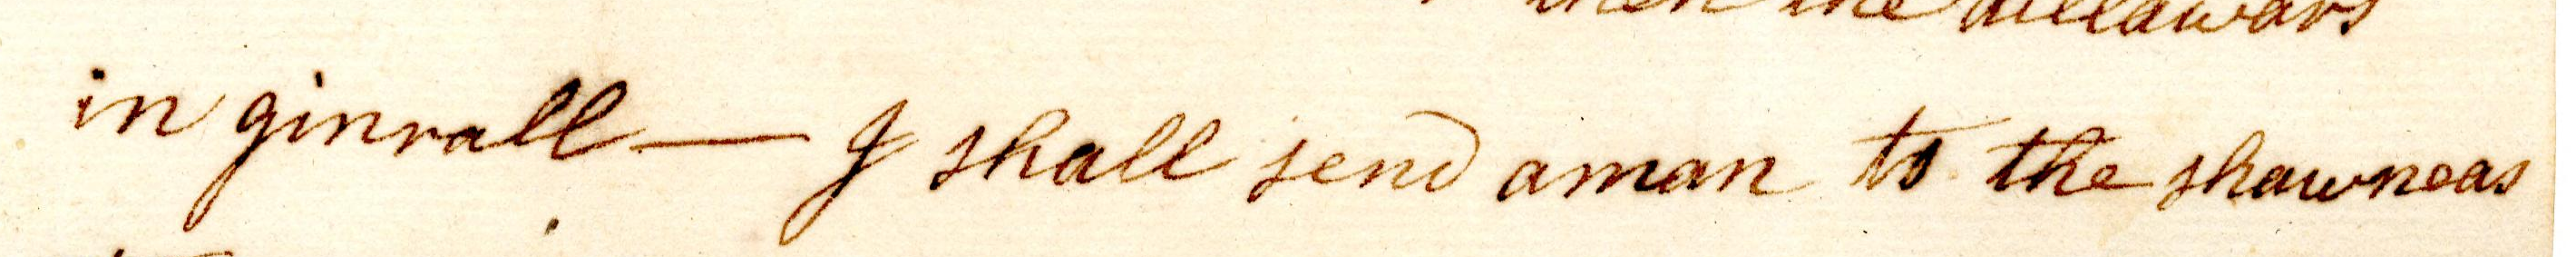in ginrall- I shall send aman to the shawneas
